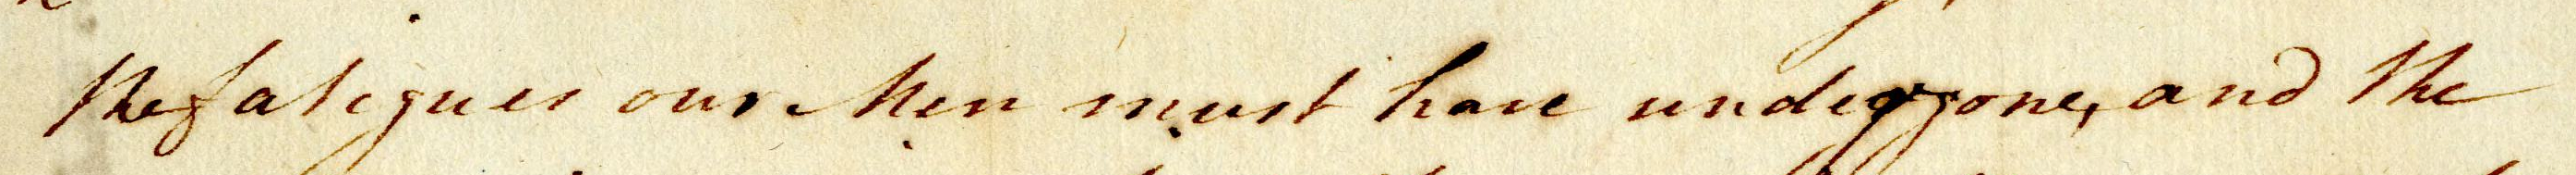the fatigues our Men must have undergone, and the
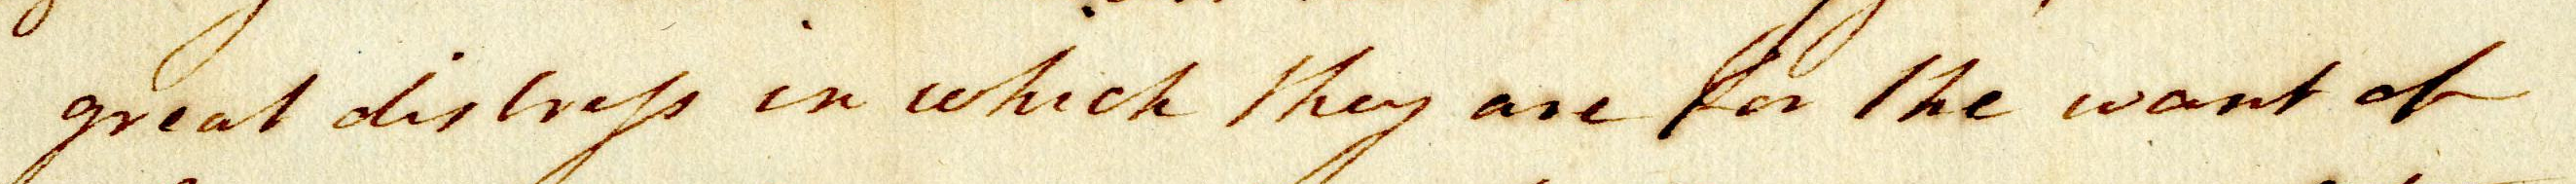great distress in which they are for the want of
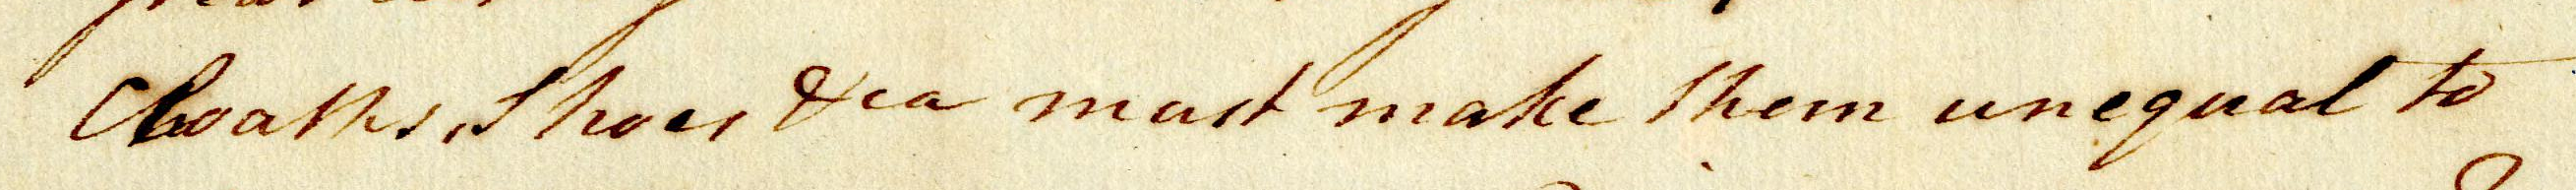Cloaths, Shoes &ca must make them unequal to
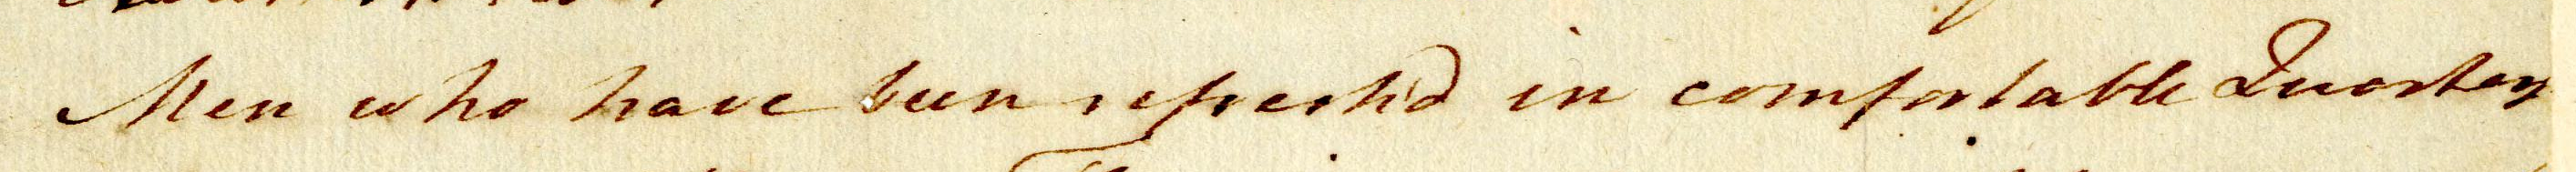Men who have been refresh'd in comfortable Quarters
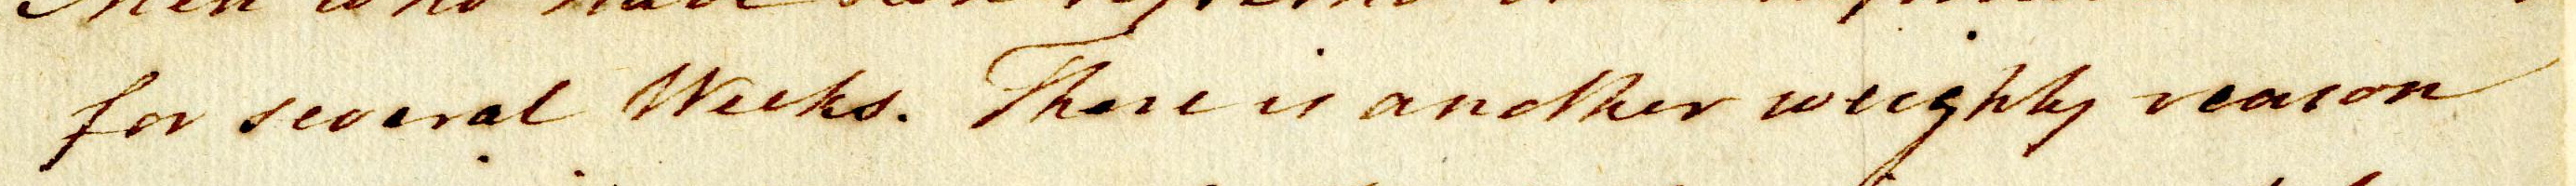for several Weeks. There is another weighty reason
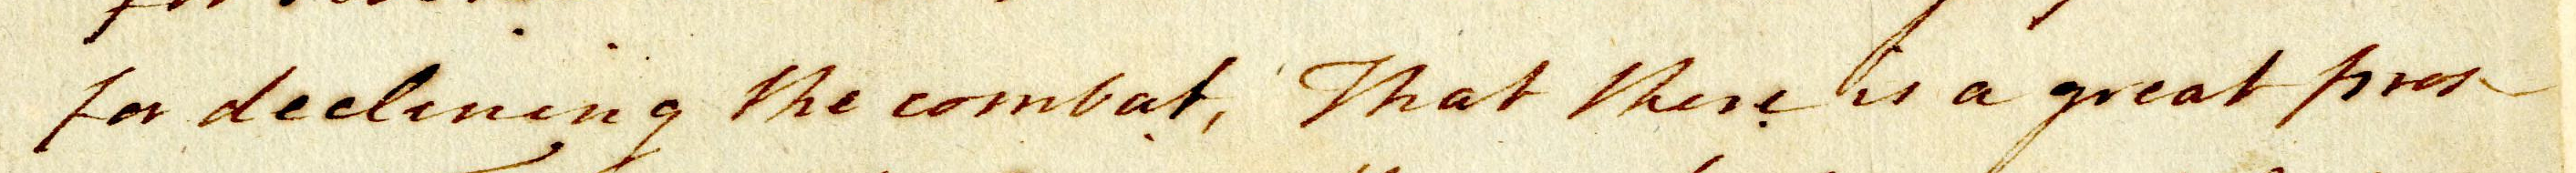for declining the combat, That there is a great pros-
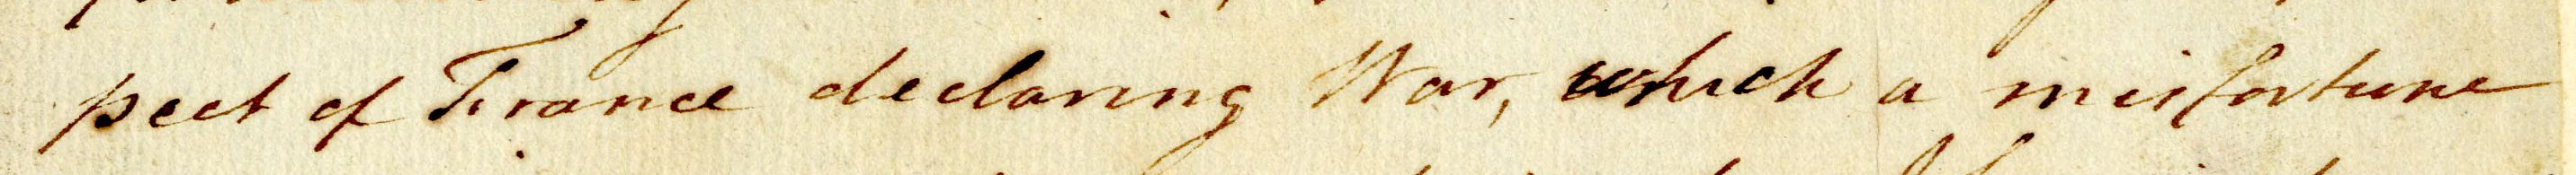pect of France declaring War, which a misfortune
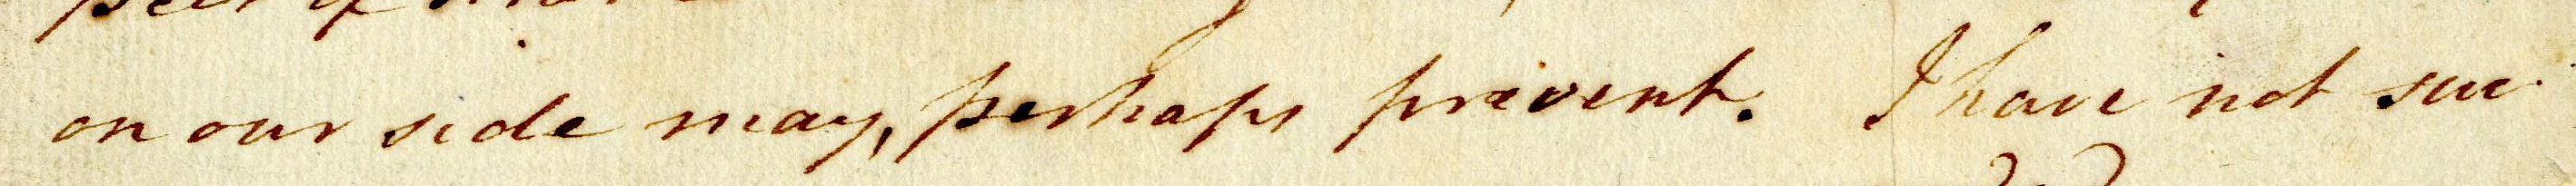on our side may, perhaps prevent. I have not suc
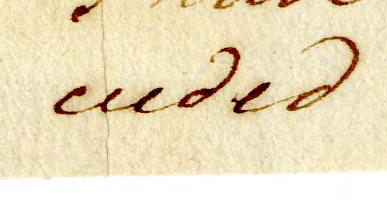ceeded
